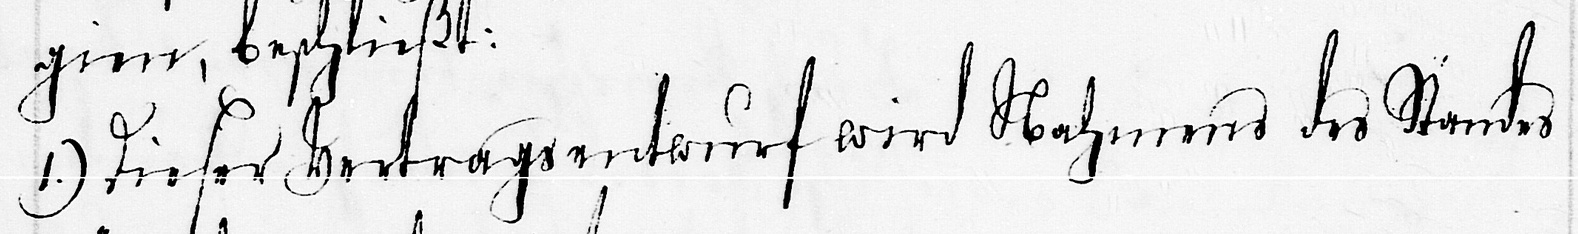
1.) Dieser Vertragsentwurf wird Nahmens des Standes
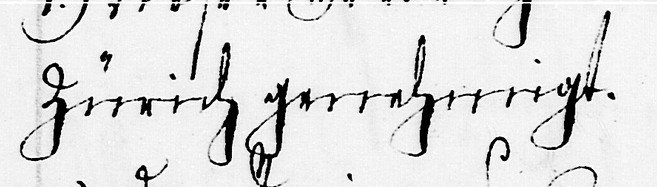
Zürich genehmigt.
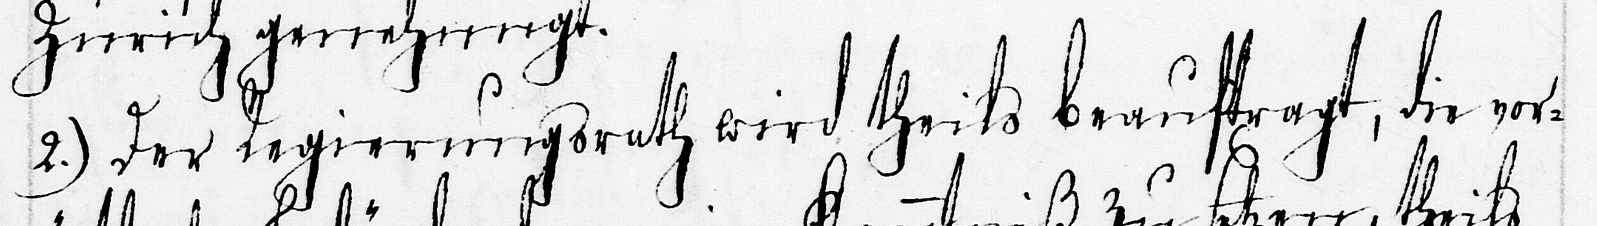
2.) Der Regierungsrath wird theils beauftragt, die vor¬
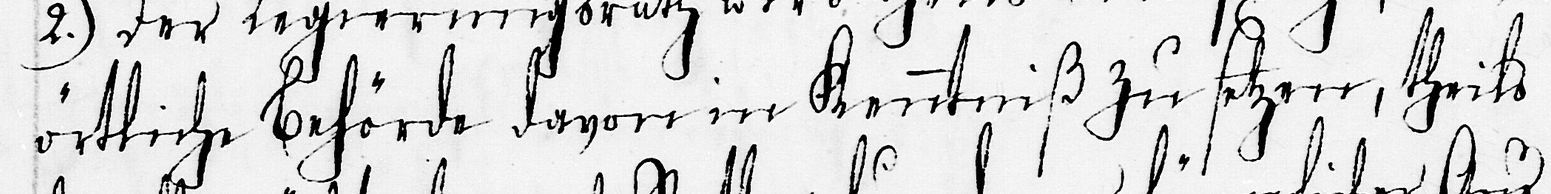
örtliche Behörde davon in Kenntniß zu setzen, theils
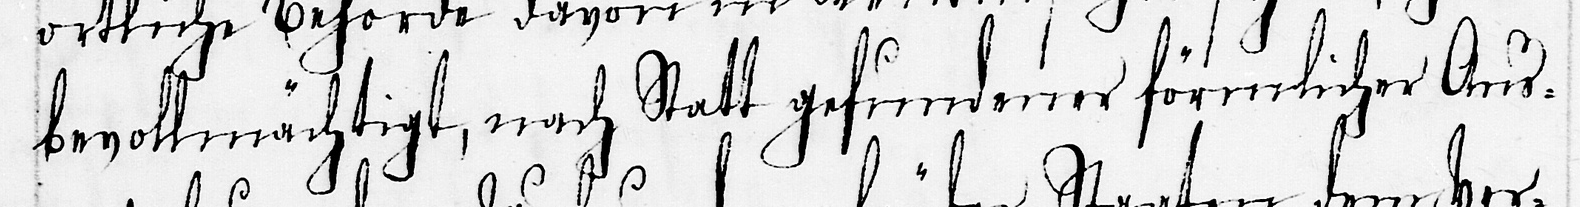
bevollmächtigt, nach Statt gefundener förmlicher Aus¬
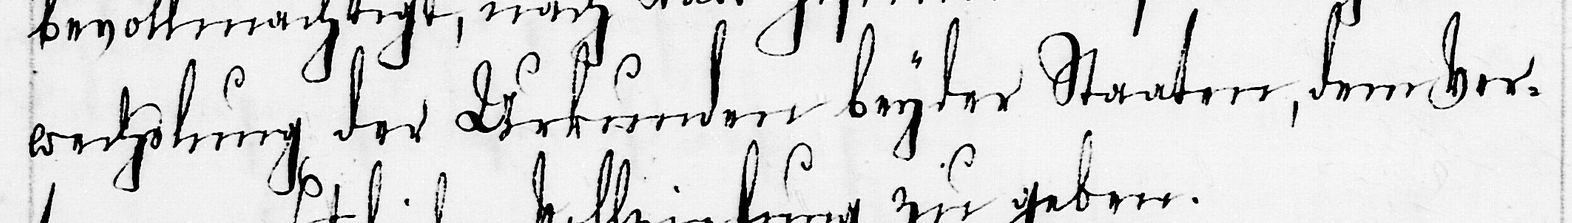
wechslung der Urkunden beyder Staaten, dem Ver¬
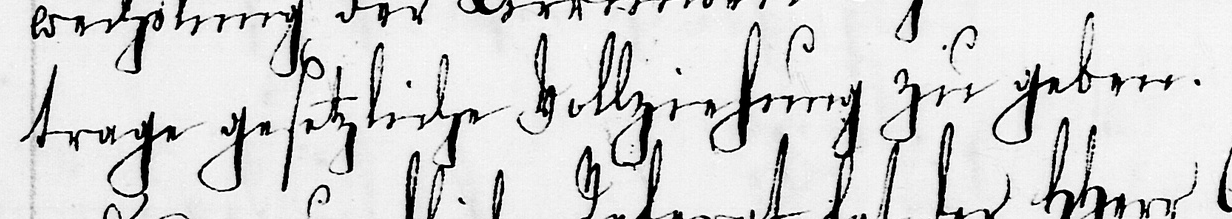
trage gesetzliche Vollziehung zu geben.
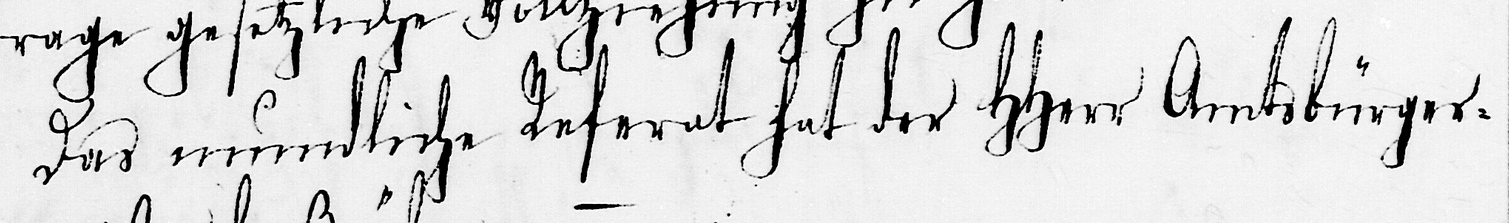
Das mundliche Referat hat der HHerr Amtsbürger¬
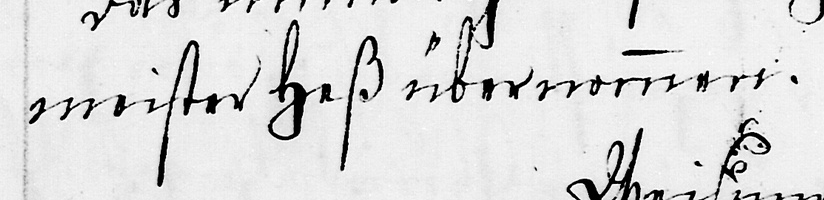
meister Heß übernommen.
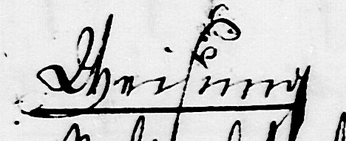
Weisung
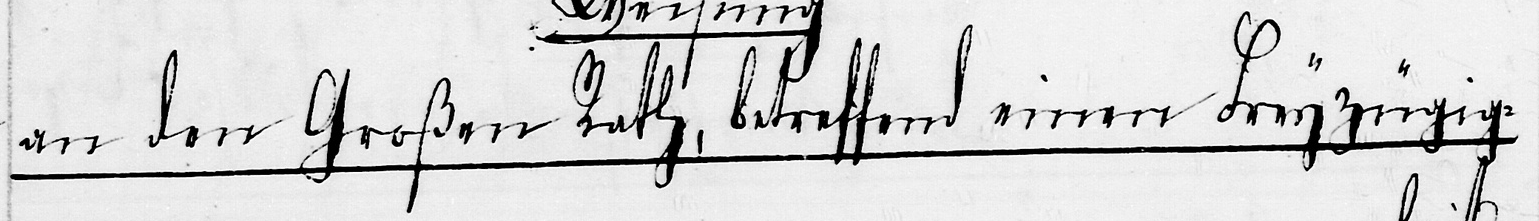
an den Großen Rath, betreffend einen Freyzügig-
